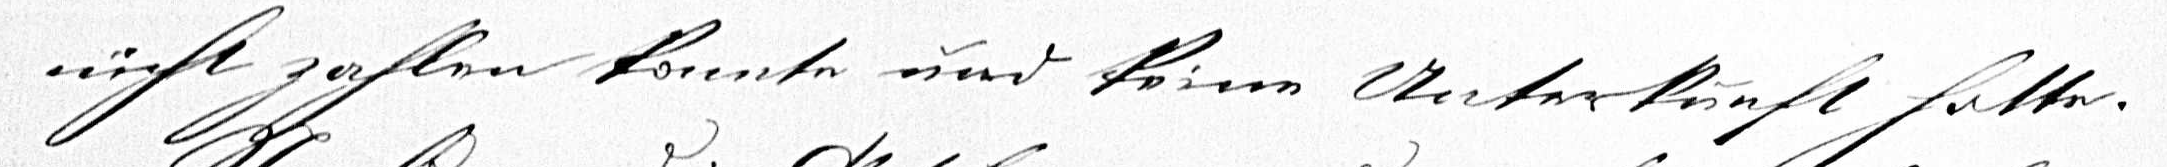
nicht zahlen konnte und keine Unterkunst hatte.
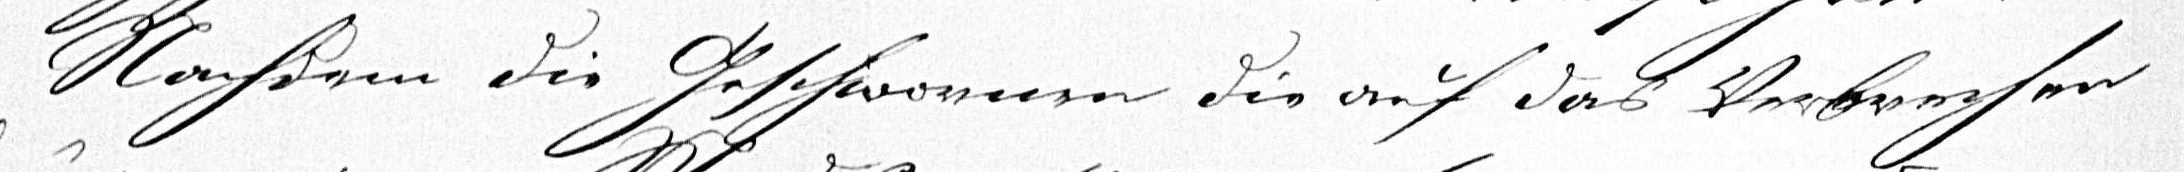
Nachdem die Geschwornen die auf das Verbrechen
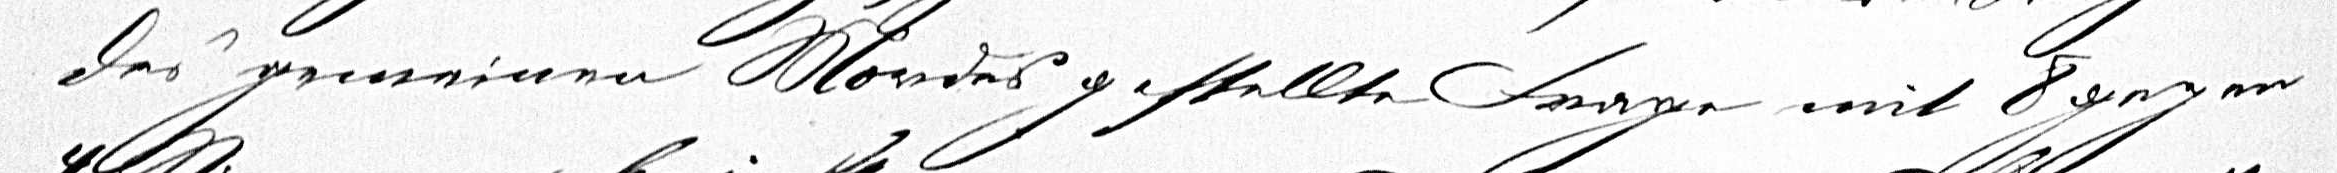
des gemeinen Mordes gestellte Frage mit 8 gegen
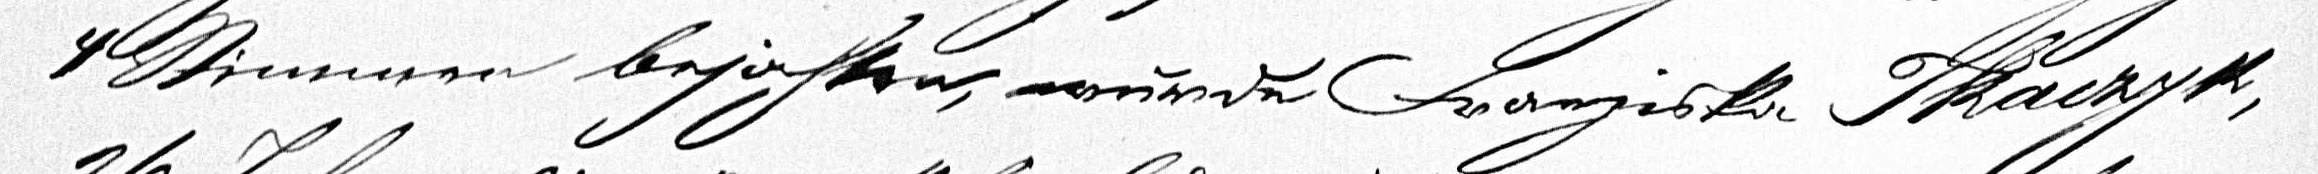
4 Stimmen bejahten, wurde Franziska Tkaczyk,
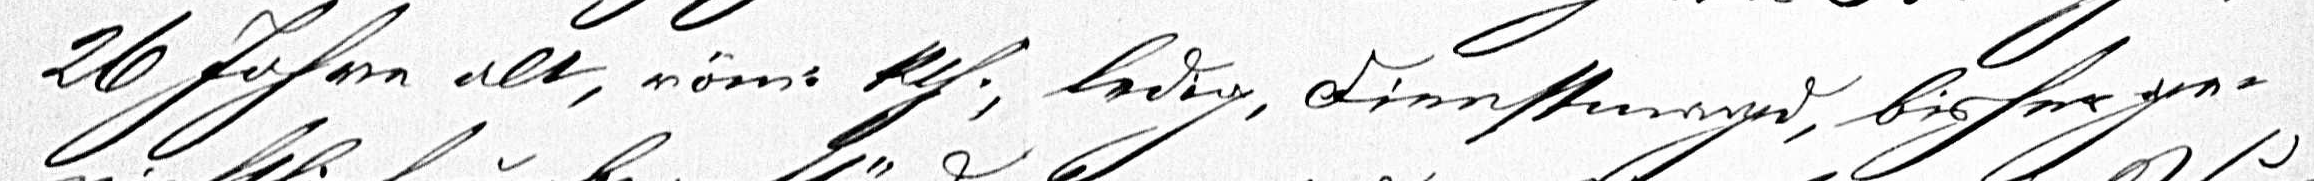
26 Jahre alt, röm: kth., ledig, Dienstmagd, bisher ge¬
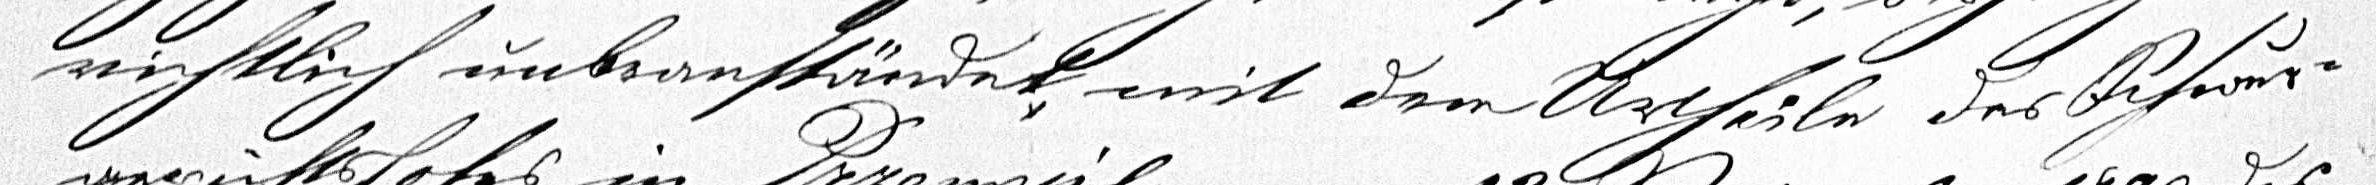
richtlich unbeanständet, mit dem Urtheile des Schwur¬
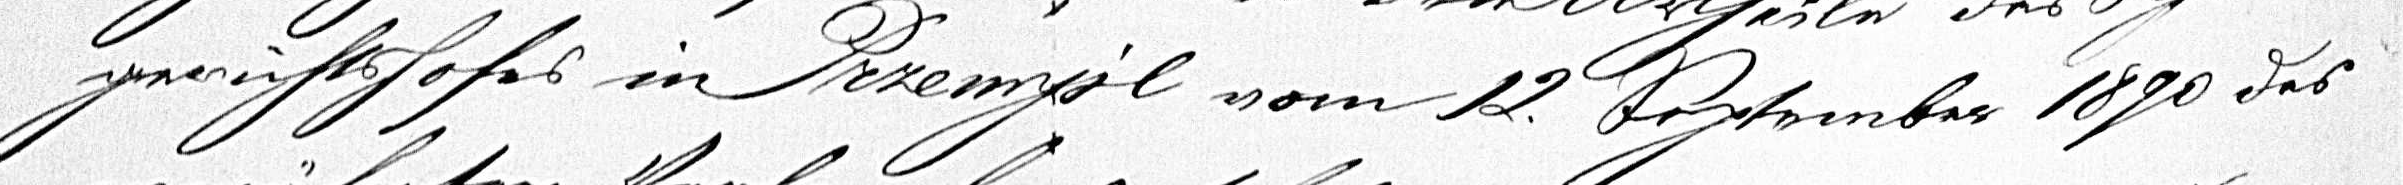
gerichtshofes in Przemyśl vom 12. September 1890 des
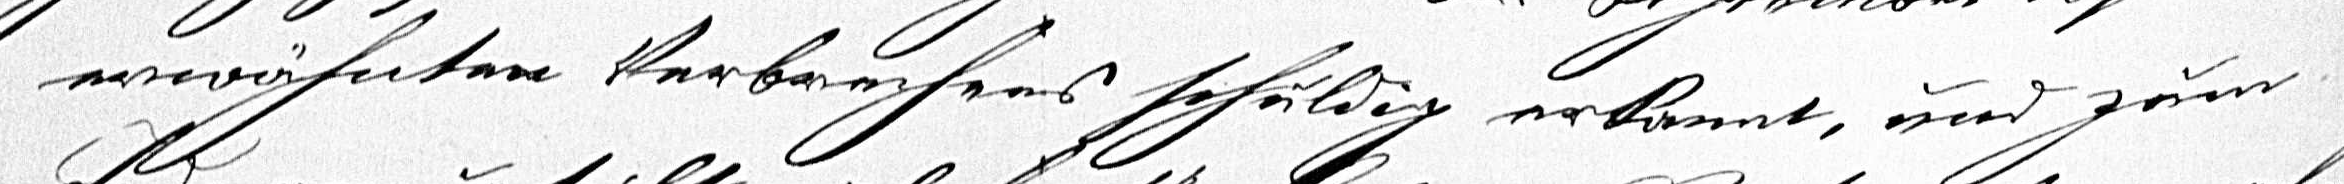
erwähten Verbrechens schuldig erkannt, und zum
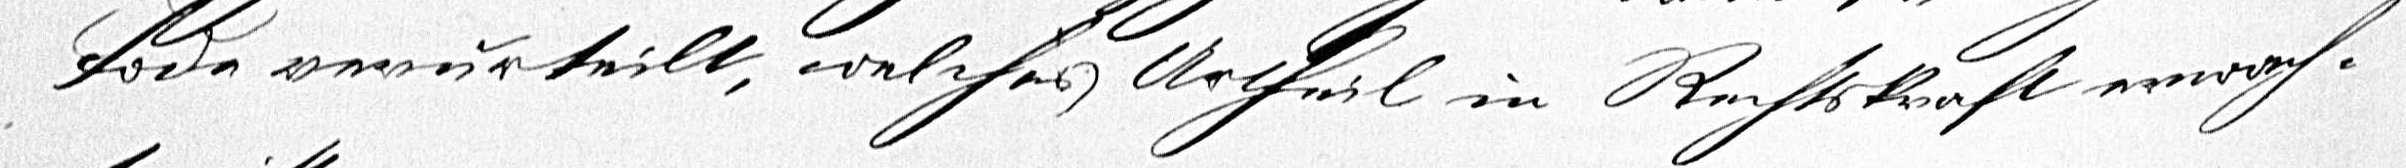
Tode verurteilt, welches Urtheil in Rechtskraft erwach¬
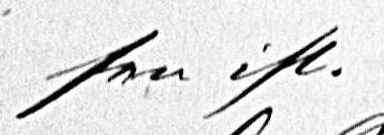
sen ist.
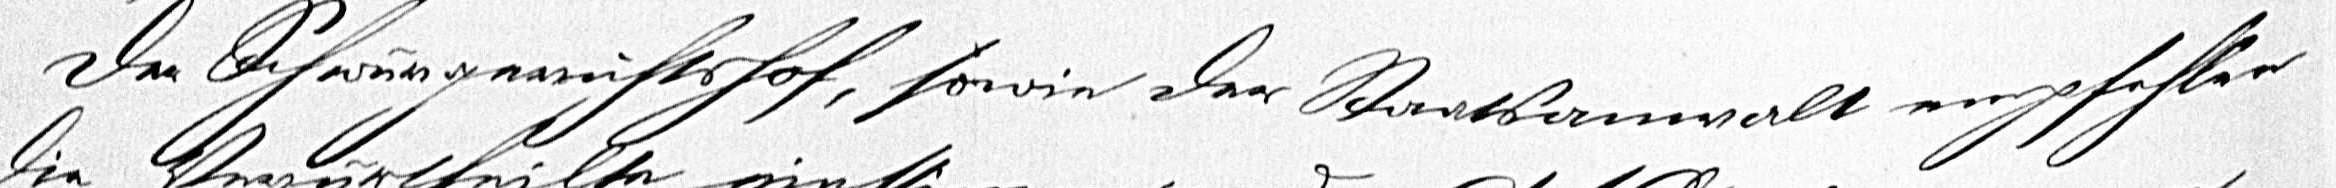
Der Schwurgerichtshof, sowie der Staatsanwalt empfehlen
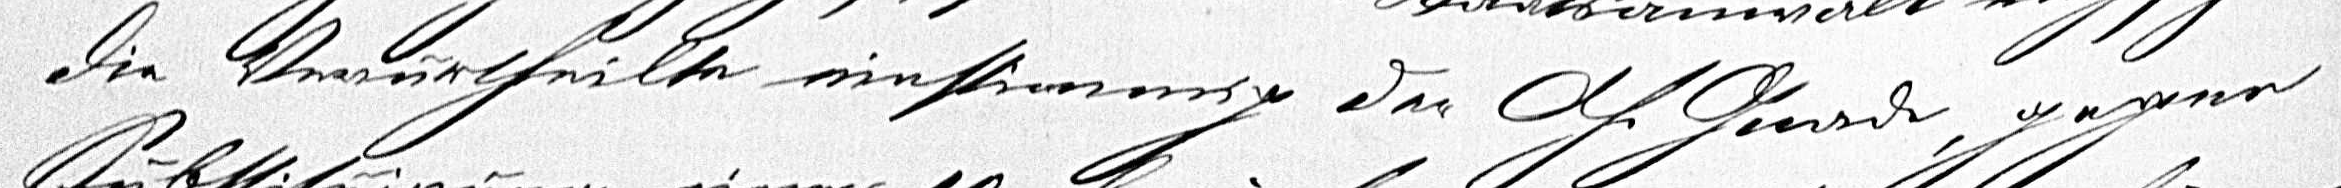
die Verurtheilte einstimmig der Ah. Gnade, gegen
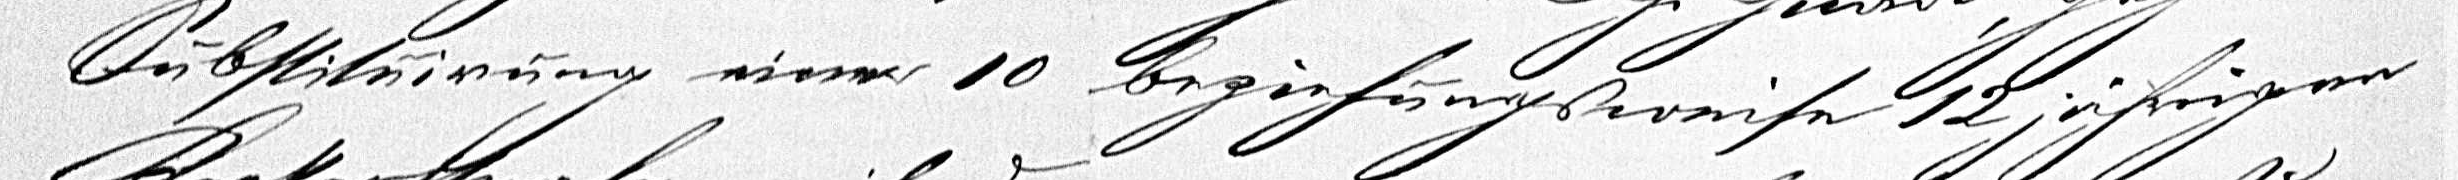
Substituirung einer 10 beziehungsweise 12 jährigen
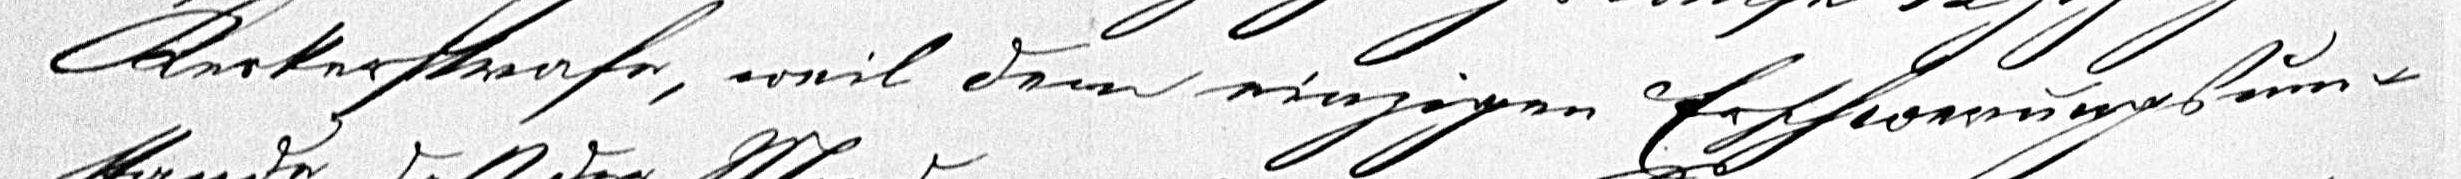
Kerkerstrafe, weil dem einzigen Erschwerungsum¬
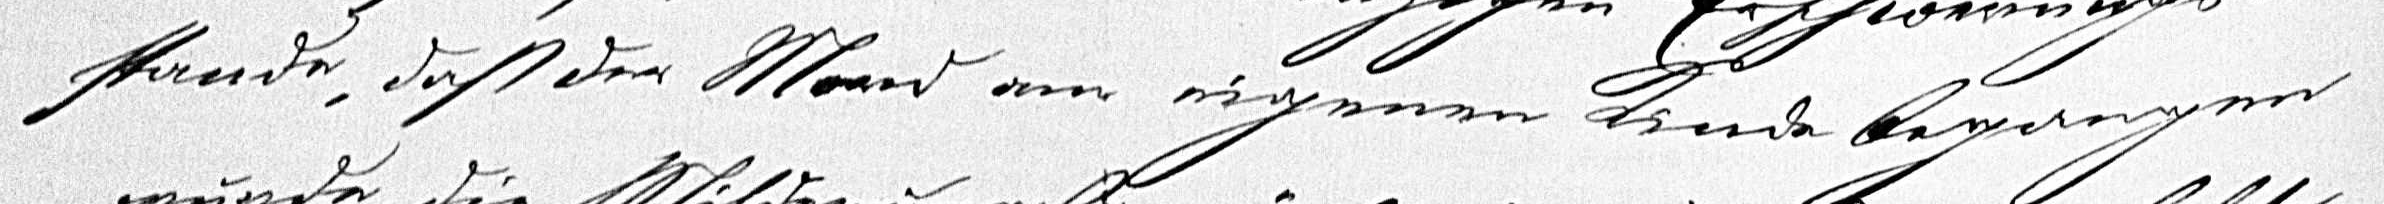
stande, daß der Mord am eigenen Kinde begangen
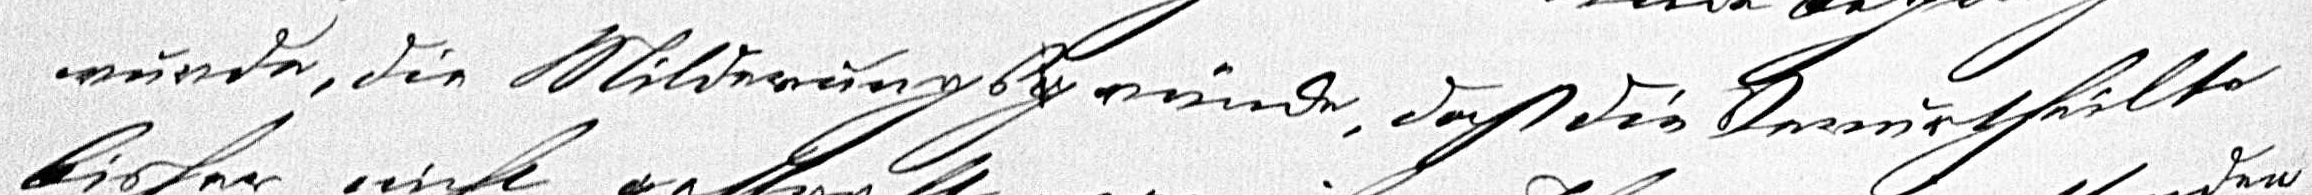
wurde, die Milderungsgründe, daß die Verurtheilte
